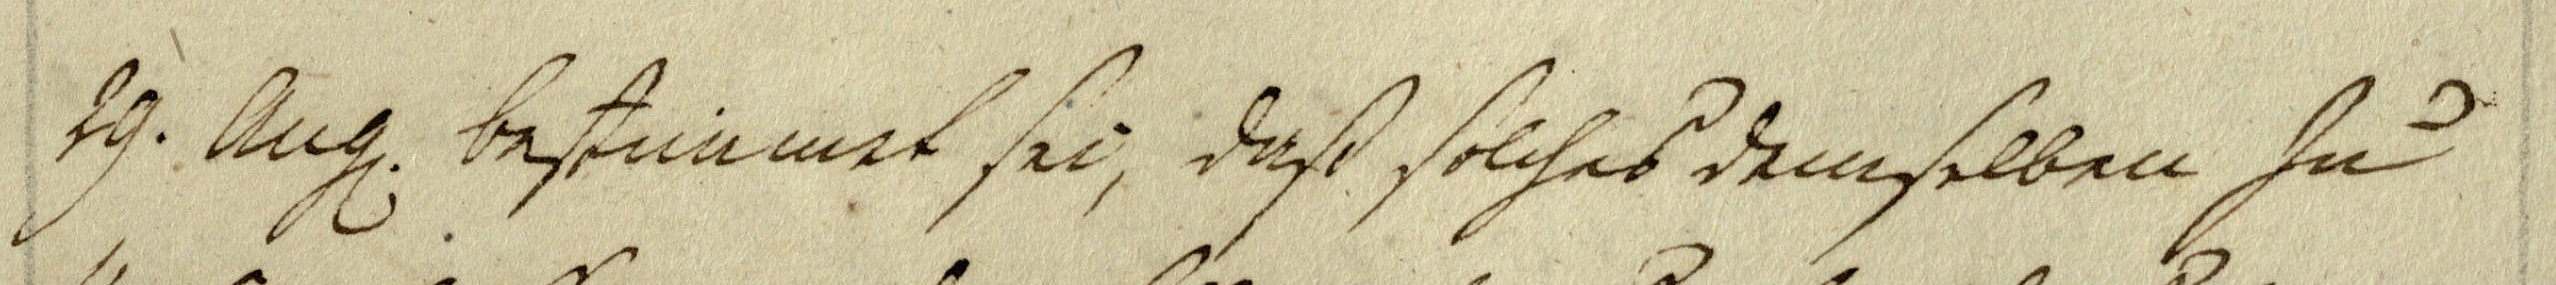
29. Aug. bestimmet sei, daß solches demselben zu
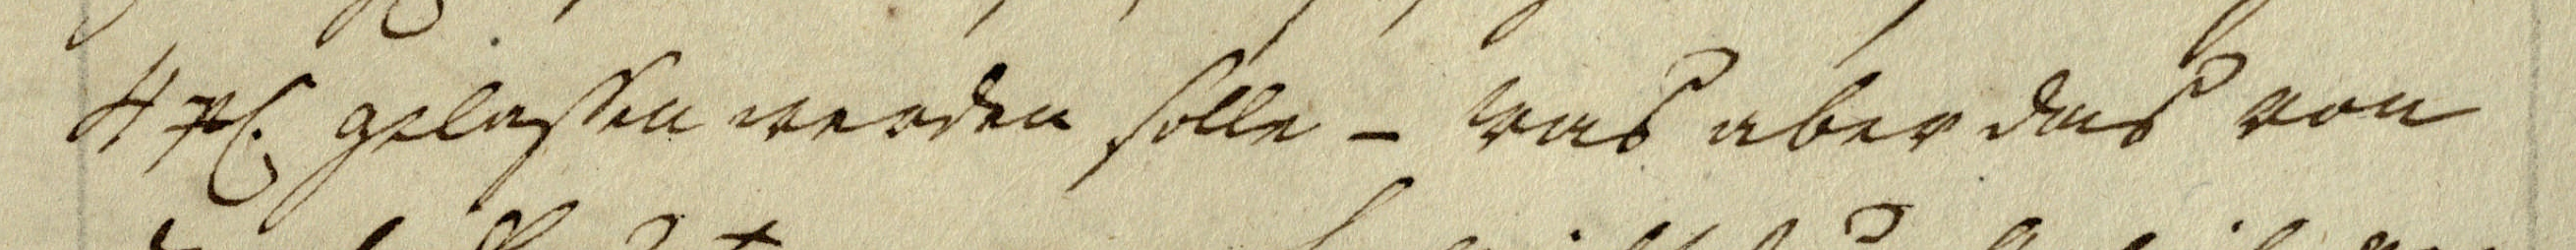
4 pl. gelassen werden solle - Was aber das von
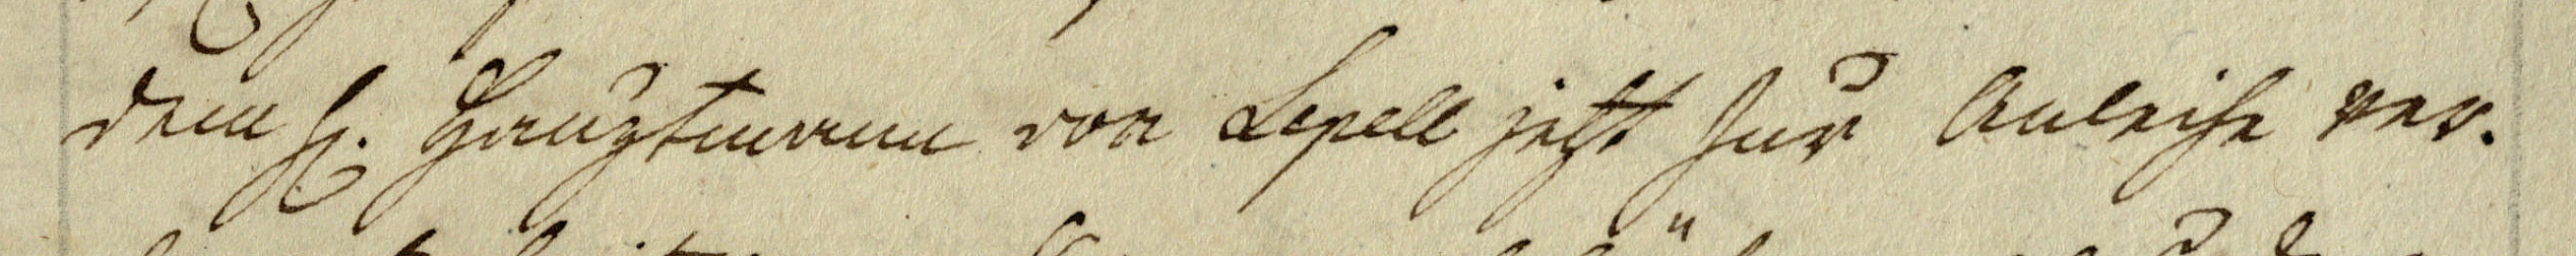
dem H. Hauptmann von Lepell jetzt zur Anleihe ver¬
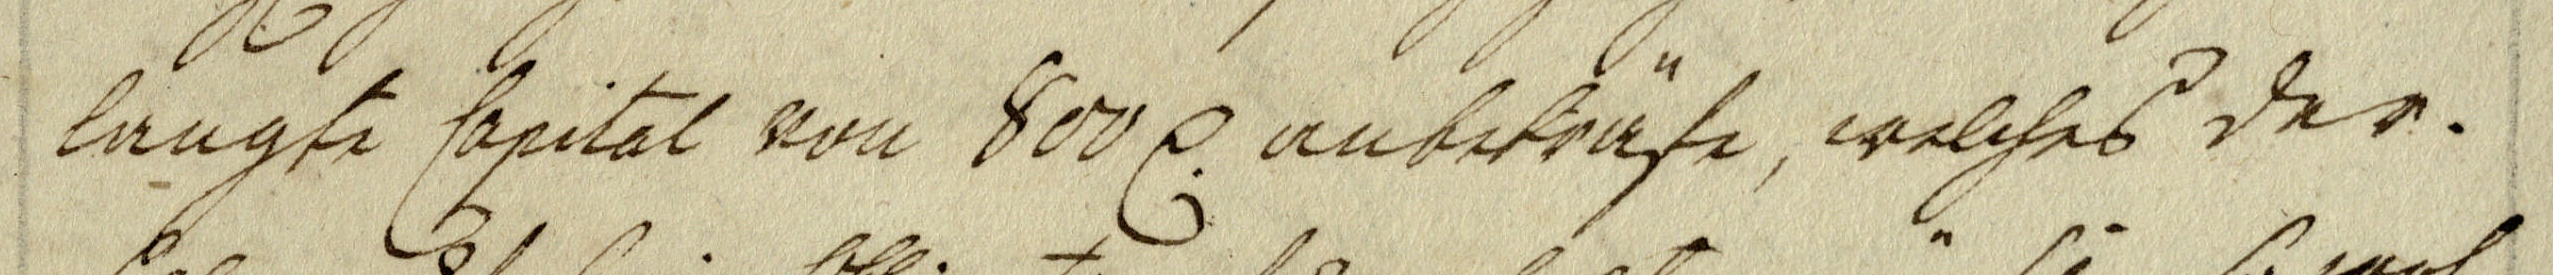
langte Capital von 800 c. anbeträfe, welches der¬
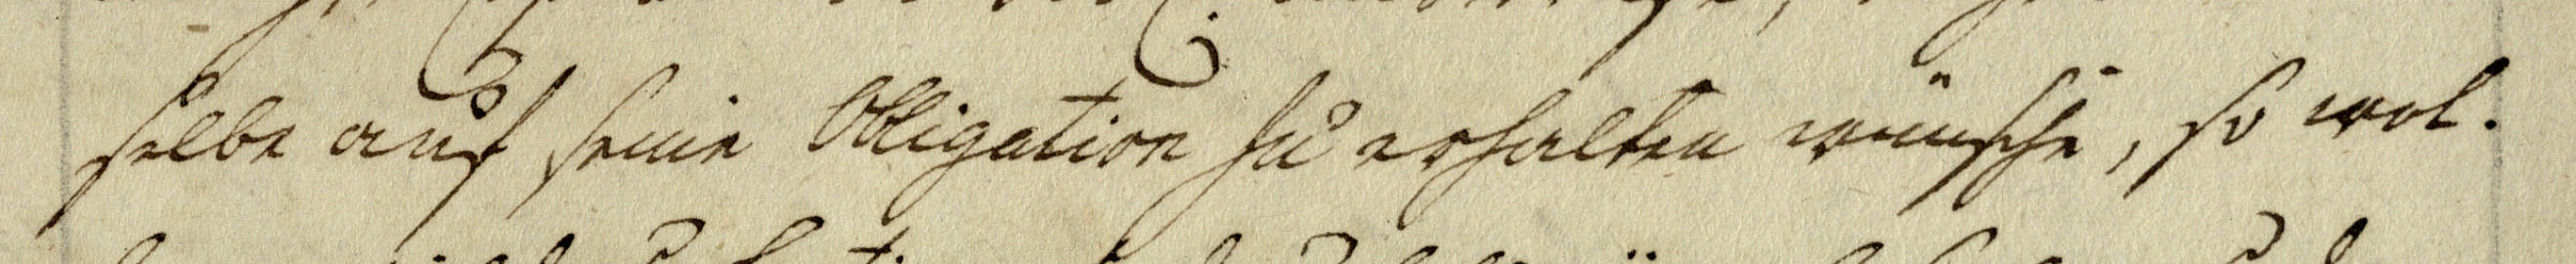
selbe auf seine Obligation zu erhalten wünsche, so wol¬
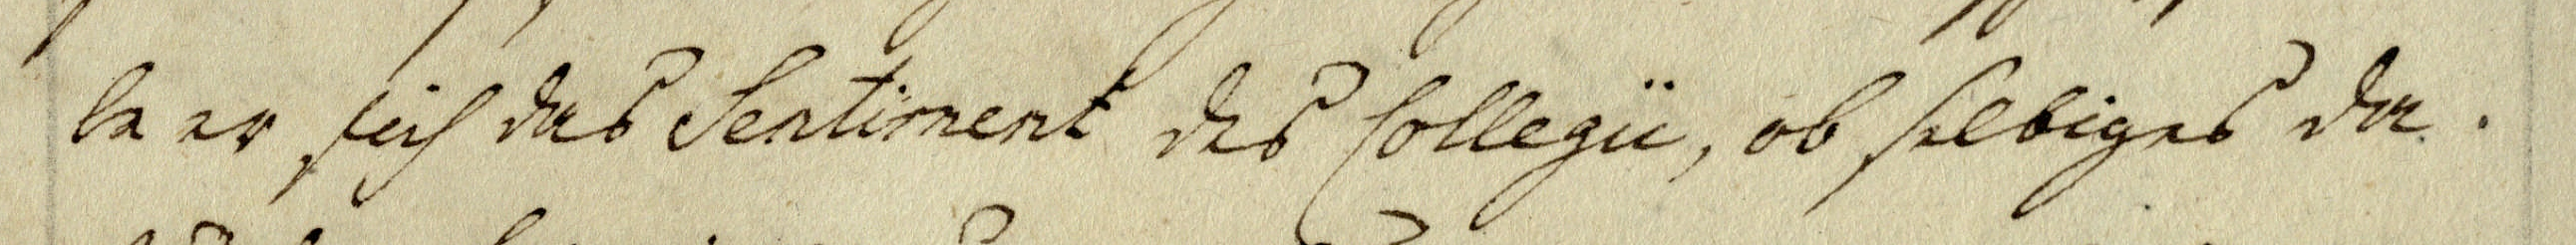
le er sich das Sentiment des Collegii, ob selbiges da¬
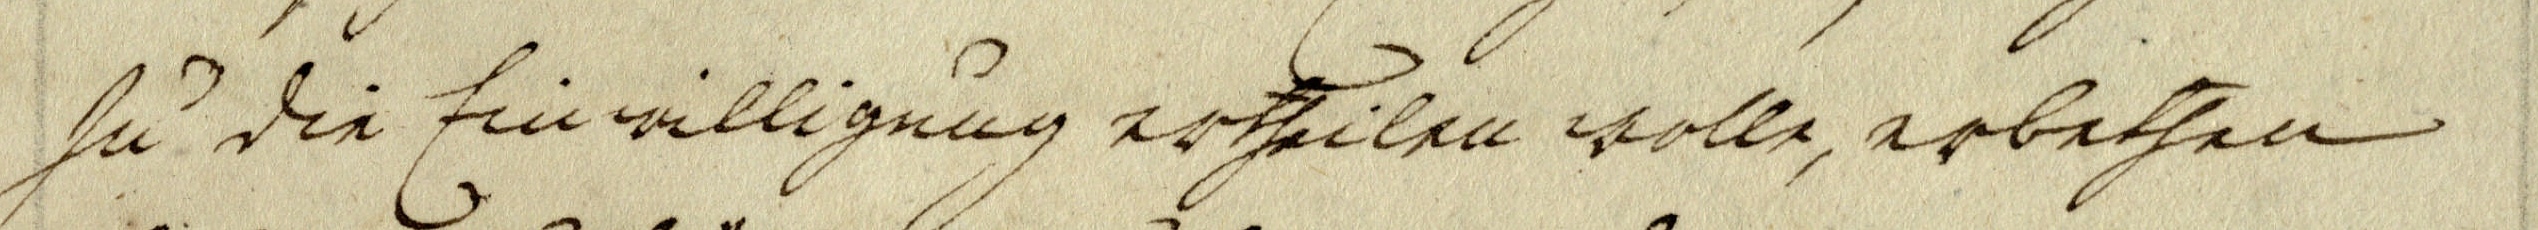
zu die Einwilligung ertheilen wolle, erbethen
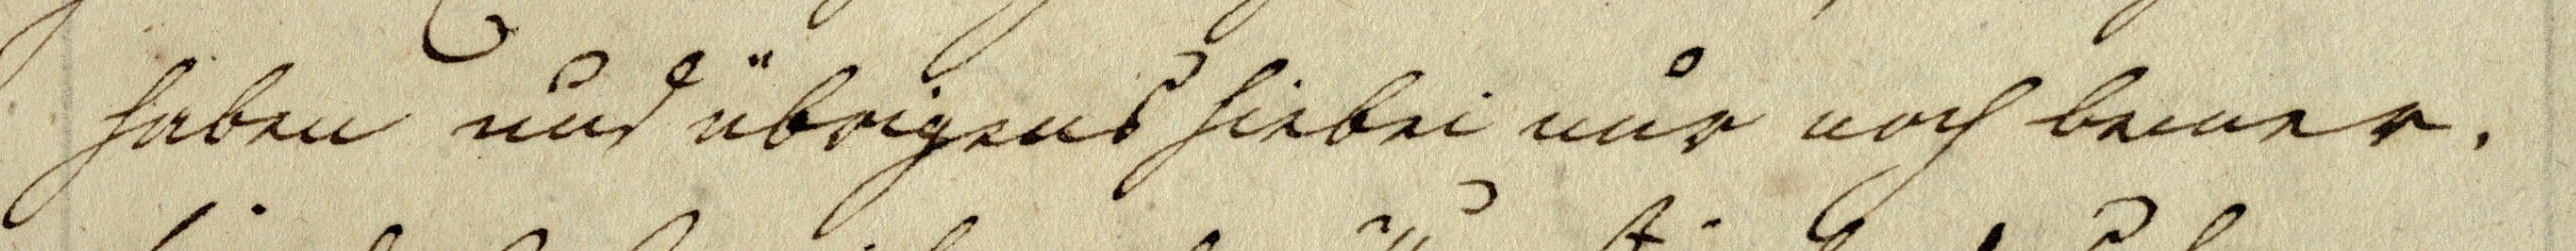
haben und übrigens hiebei nur noch bemer¬
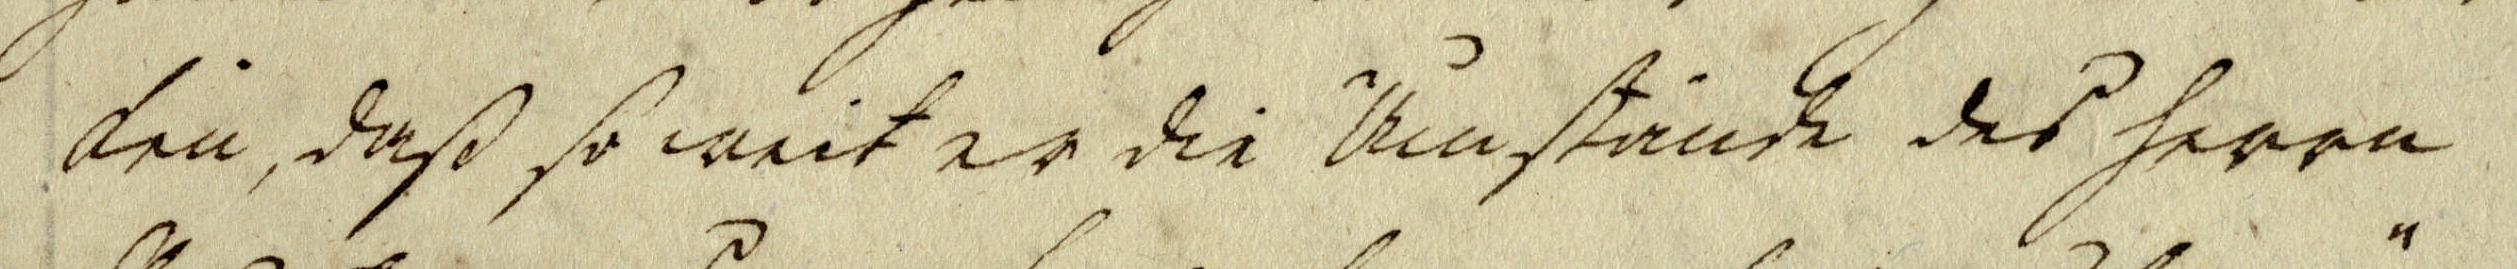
ken, daß so weit er die Umstände des Herrn
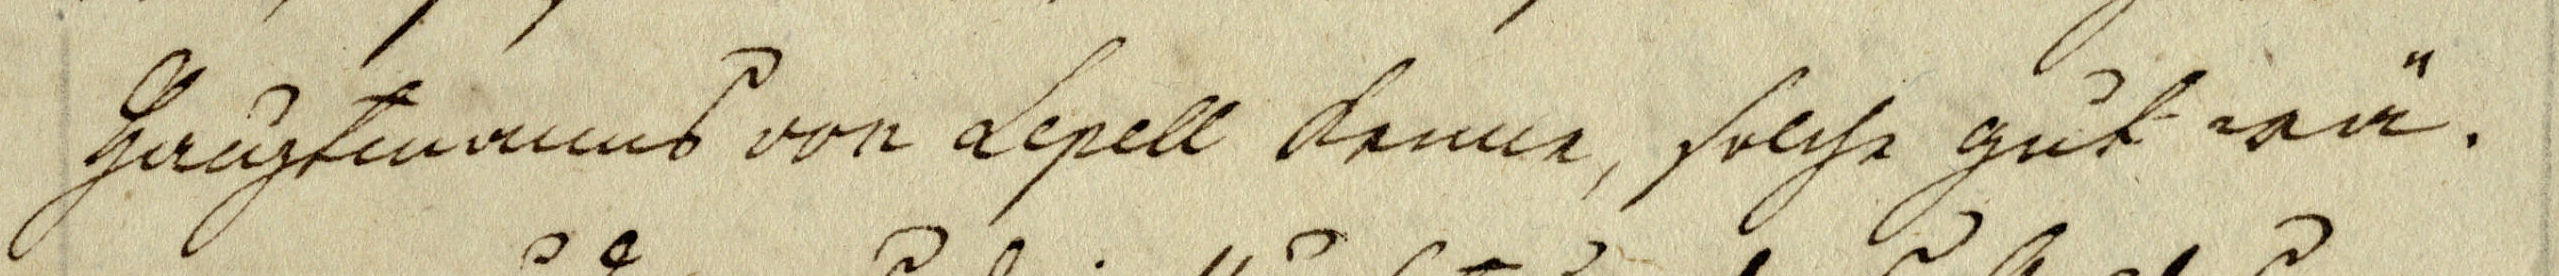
Hauptmanns von Lepell kenne, solche gut wä¬
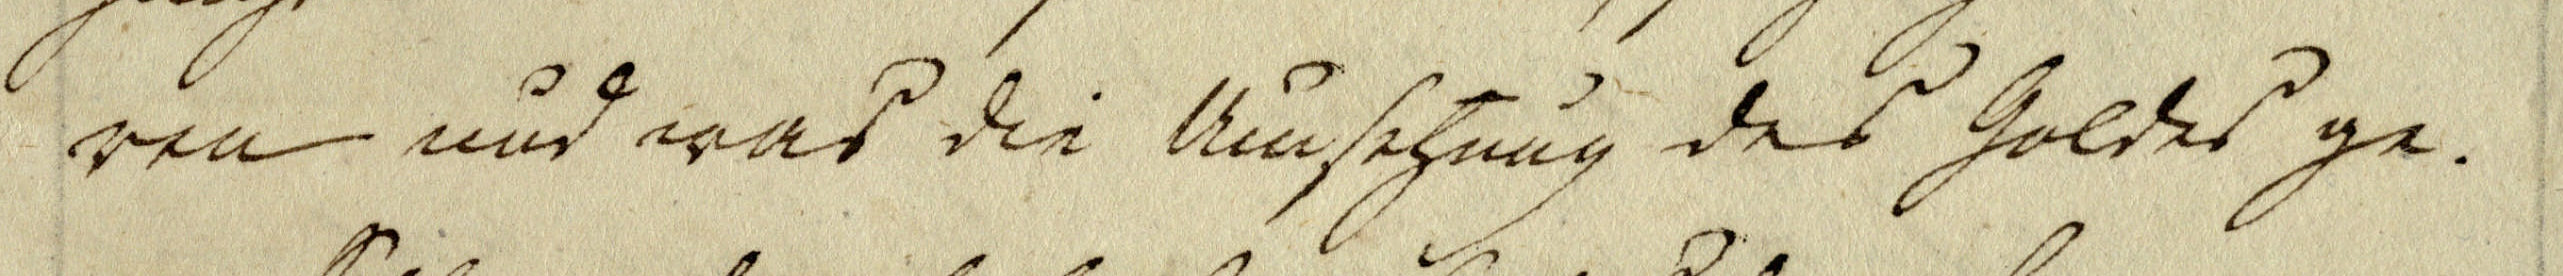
ren und was die Umsetzung des Goldes ge¬
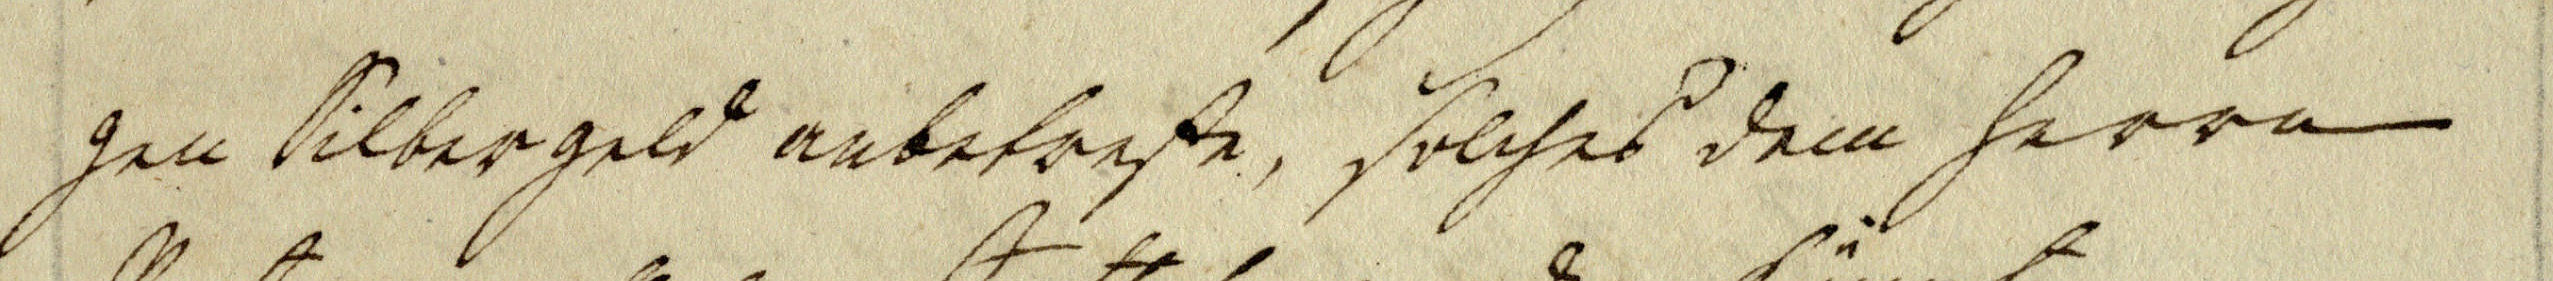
gen Silbergeld anbetreffe, solches dem Herrn
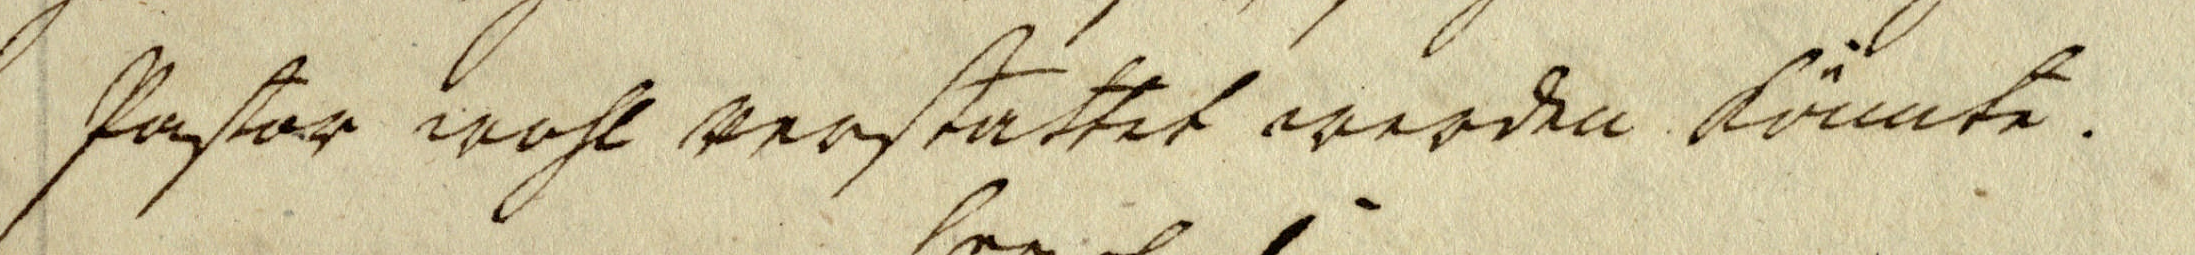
Pastor wohl verstattet werden könnte.
